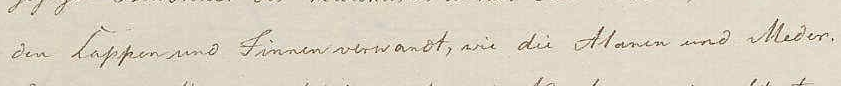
den Lappen und Finnen verwandt, wie die Alanen und Meder.
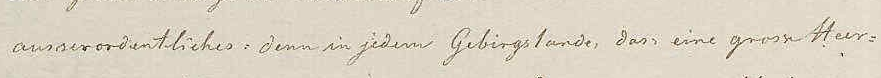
ausserordentliches: denn in jedem Gebirgslande, dass eine grosse Heer-
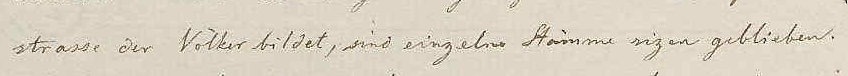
strasse der Völker bildet, sind einzelne Stämme sizen geblieben.
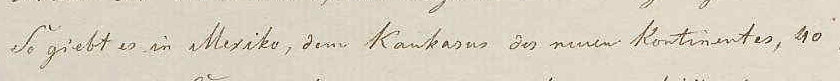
So giebt es in Mexiko, dem Kaukasus des neuen Kontinentes, 40
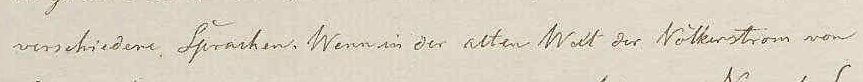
verschiedene Sprachen. Wenn in der alten Welt der Völkerstrom von
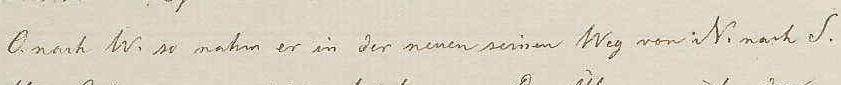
O. nach W. so nahm er in der neuen seinen Weg von N. nach S.
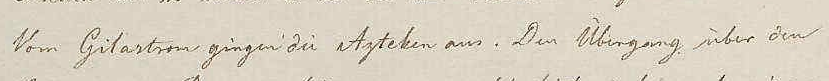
Vom Gilastrom gingen die Azteken aus. Den Übergang über den
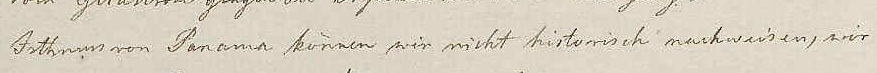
Isthmus von Panama können wir nicht historisch nachweisen, wir
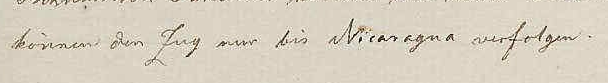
können den Zug nur bis Nicaragua verfolgen.
